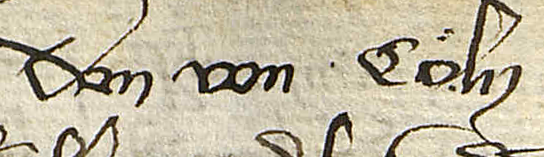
Den von Cöln
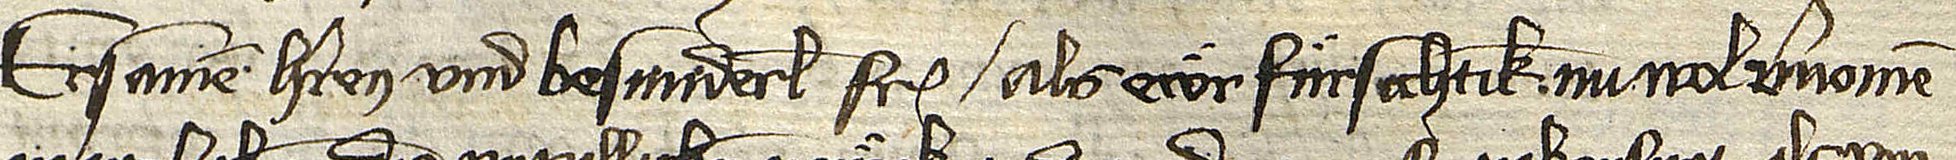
Erſame* h*ren vnd beſunderl* fr* / als eẅr fürſichtik* nu wol v*nome*
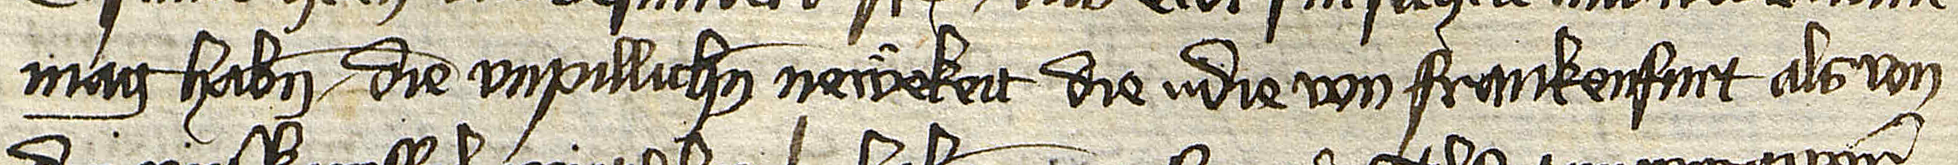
mag habn* / die vnpillichn* neẅekeit die ~ die von frankenfurt als von
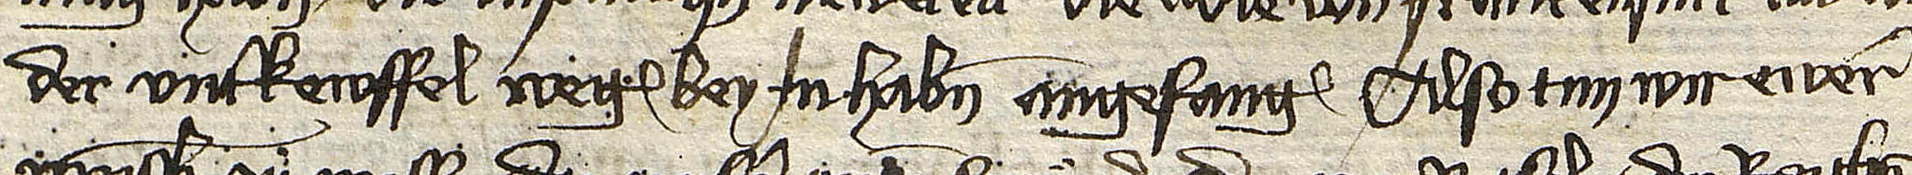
der vnt*kewffel weg* bey In habn* angefang* Alſo tun wir ewer*
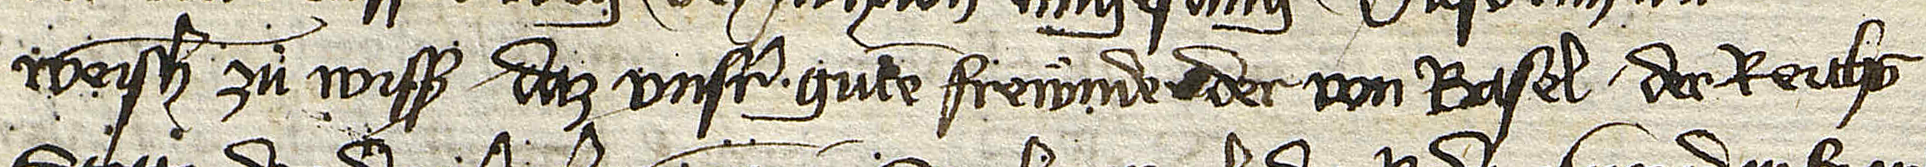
weiſh* ʒu wiſſ* / daʒ vnſr* gute* freẅnde der von Baſel / der Reichs
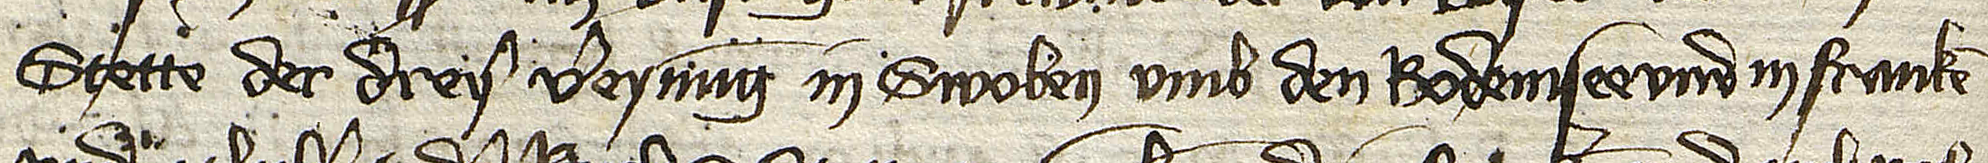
Stette der drey* v*eynu*g in Swoben vmb den Bodemſee vnd in franke*
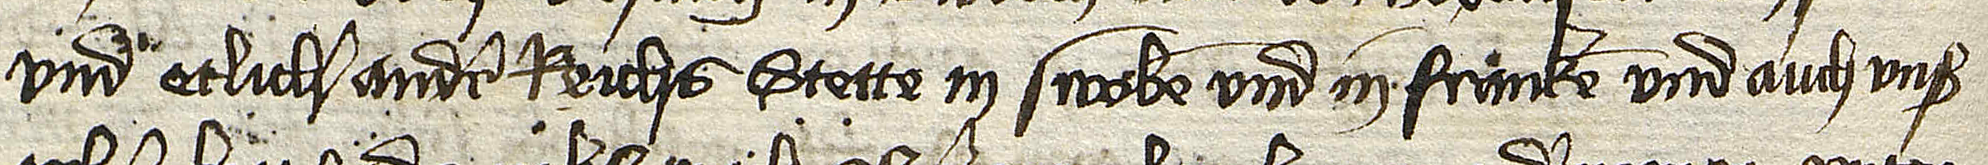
vnd etlich* andr* Reichs Stette in ſwobe* vnd in franke* vnd auch vnſ*
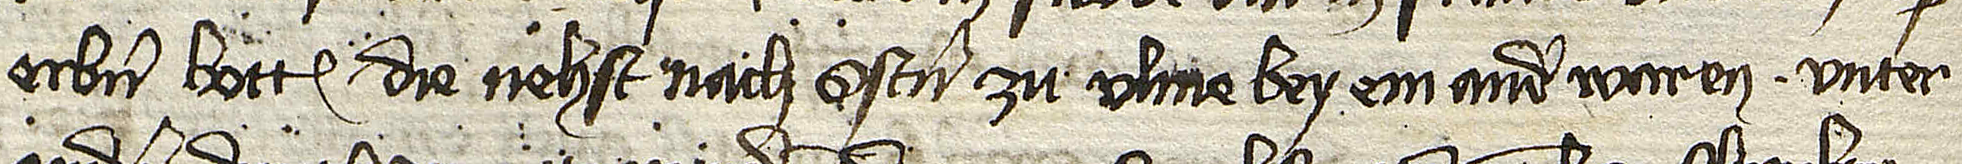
erbn* bott* / die nehſt nach Oſtn* ʒu vlme bey ein and* waren . vnter
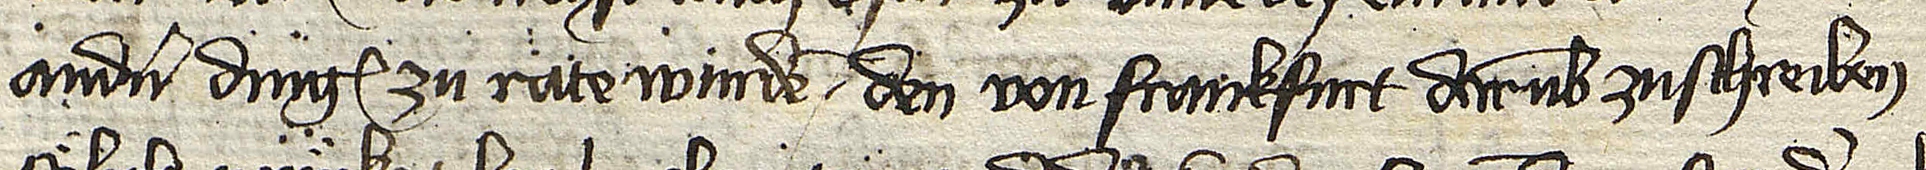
andn* ding* ʒu rate wurde* / den von frankfurt darub* ʒuſchreiben
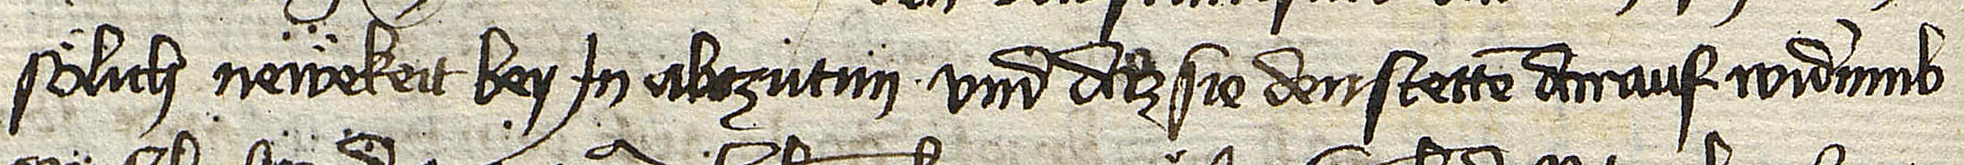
ſölich neẅekeit bey In abcʒutun vnd daʒ ſie den ſtette* darauf wid*umb
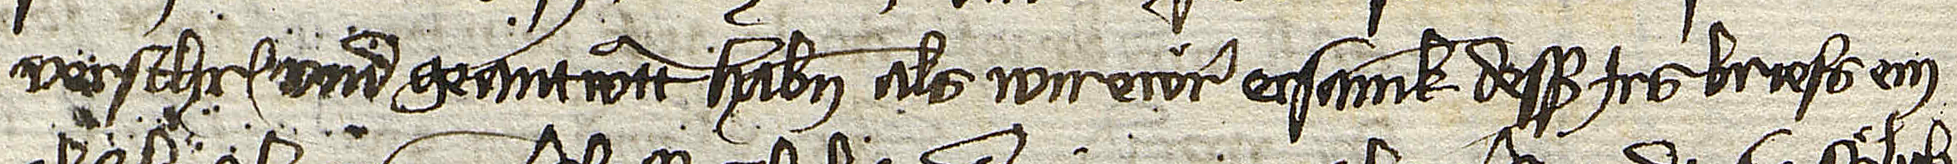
verſchr* vnd geantw*tt habn* als wir eẅr* erſamk* deſſ* Irs briefs ein
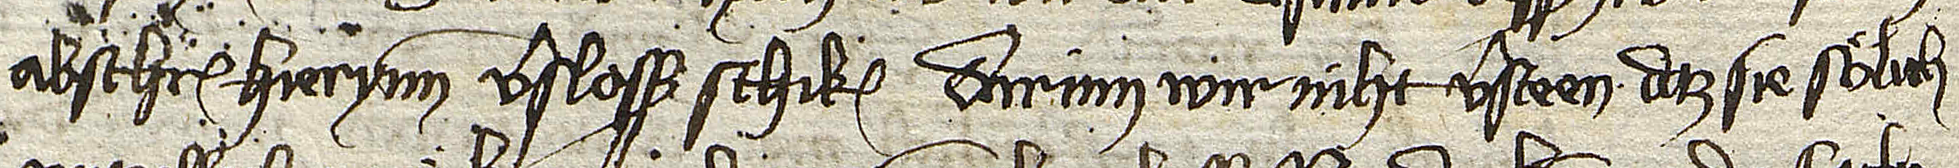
abſchr* hierynn* v*ſloſſ* ſchik* Darinn wir niht v*ſteen . daʒ ſie ſölich
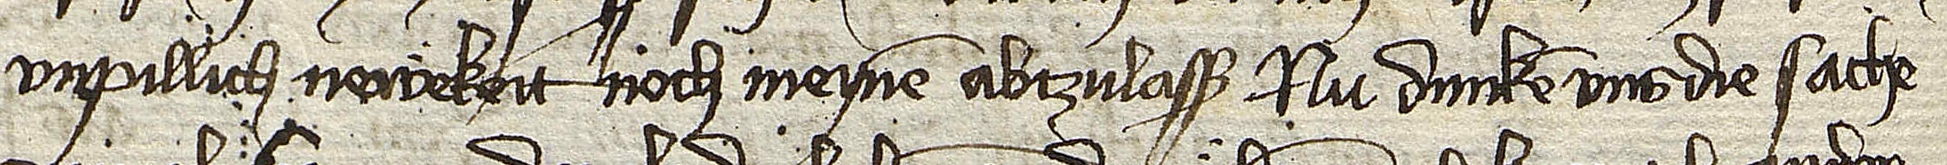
vnpillich neẅekeit noch meyne* abcʒulaſſ* Nu dunke* vns die ſache
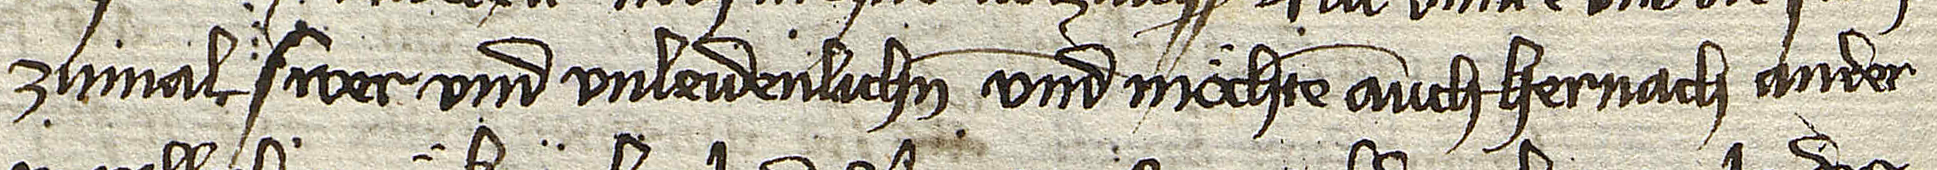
ʒumal ſwer vnd vnleidenlichn* vnd möchte* auch hernach ander
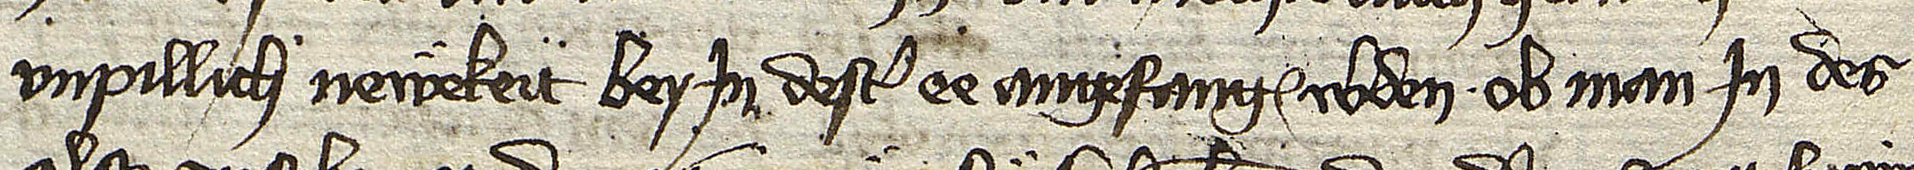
vnpillich neẅekeit bey In deſt* ee angefang* w*den . ob man In des
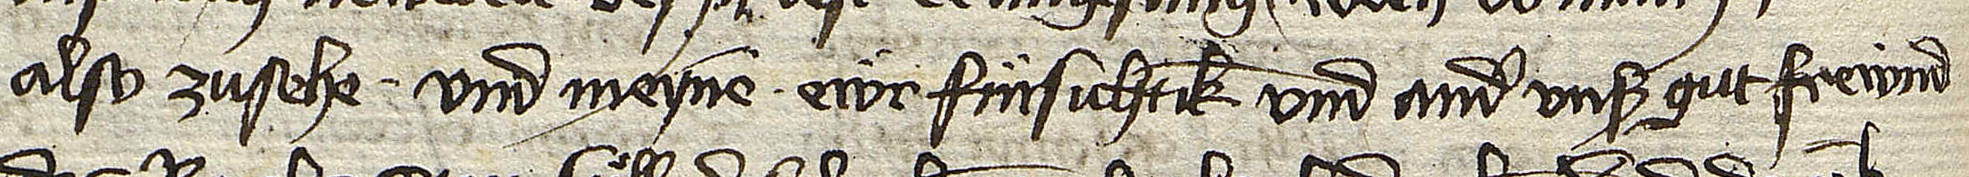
alſo ʒuſehe vnd meyne* eẅr fürſichtik* vnd and* vnſ* gut freẅnd
